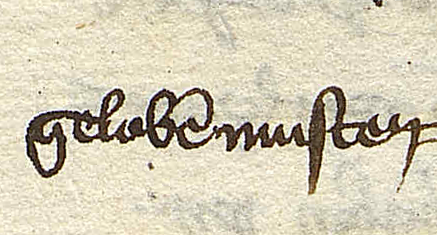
gelobe* muſten
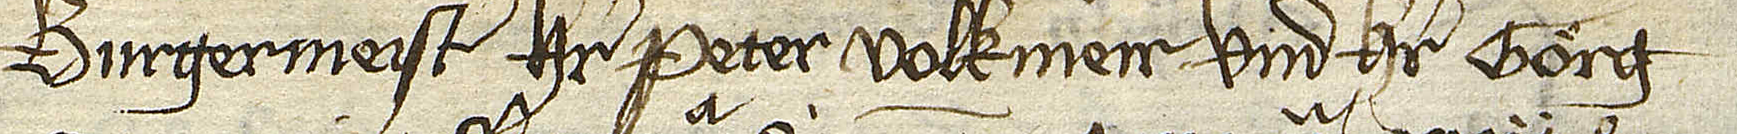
Burgermeiſt* H*r Peter volkmeir Vnd H*r Görg
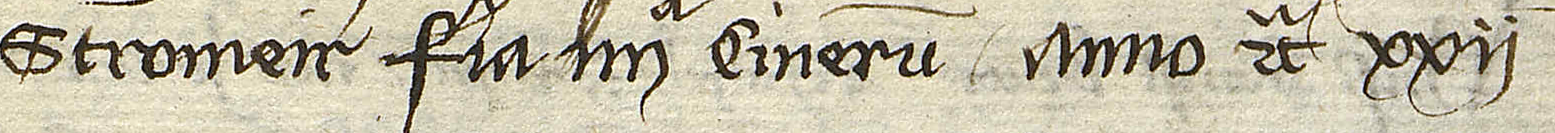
Stromeir fia* iiii* Cineru* / anno ec* xxii*
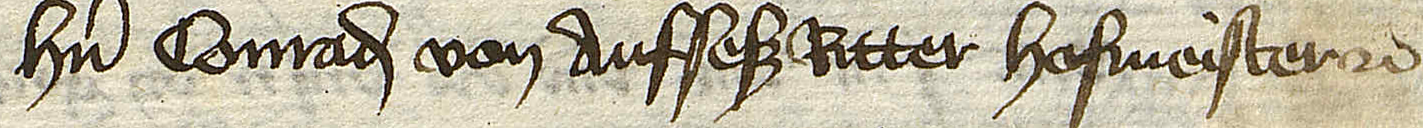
h*n Conrad* von Aufſeſʒ Ritter hofmeiſter ec*
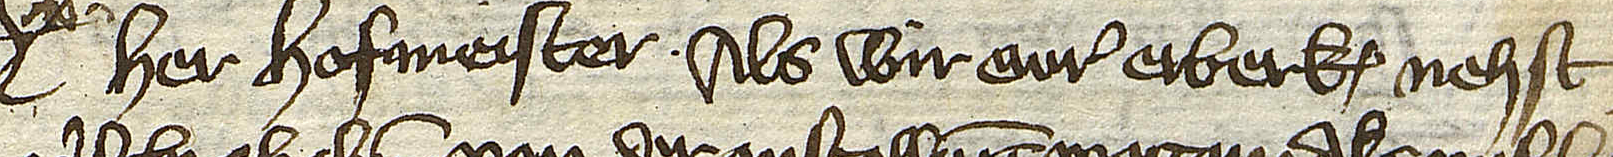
L* her hofmeiſter . Als wir ew*r erberk* nehſt
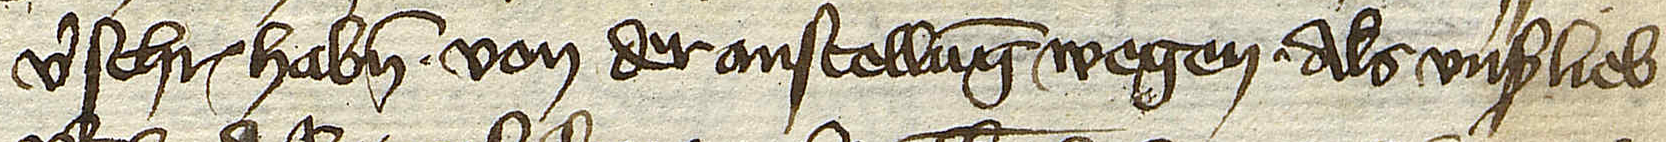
v*ſchr* hab*n . von der anſtellu*g wegen . Als vnſ* lieb
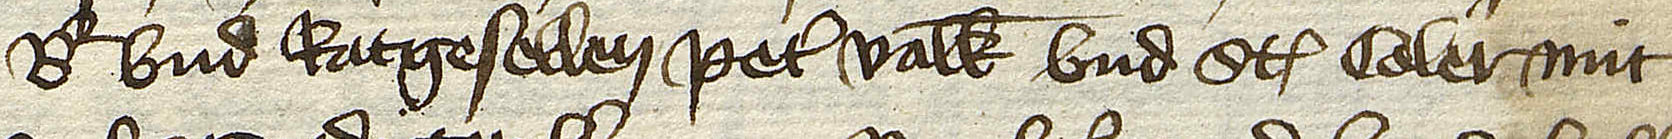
B* vnd Ratgeſellen Pet* volk* vnd St* Coler mit
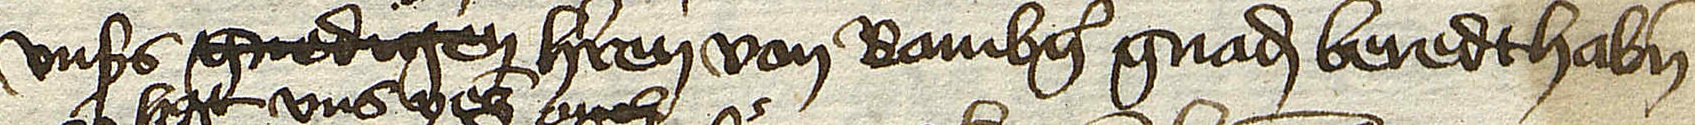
vnſ*s gnedigen h*ren von Bamb*g gnad* beredt hab*n
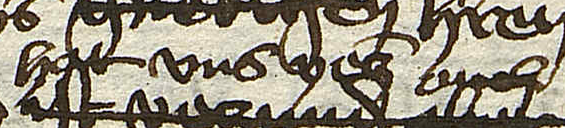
hat vns yecʒ* auch
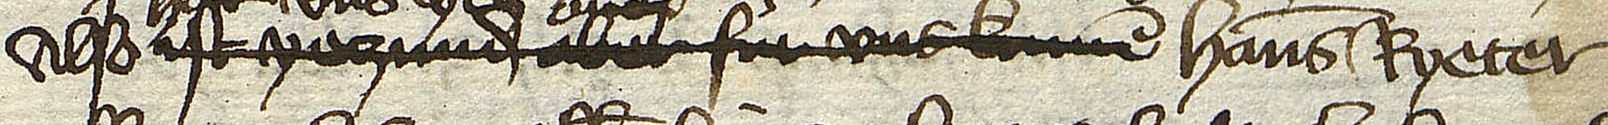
Alſo iſt yecʒund* aber für vns kume* han*s Ryeter
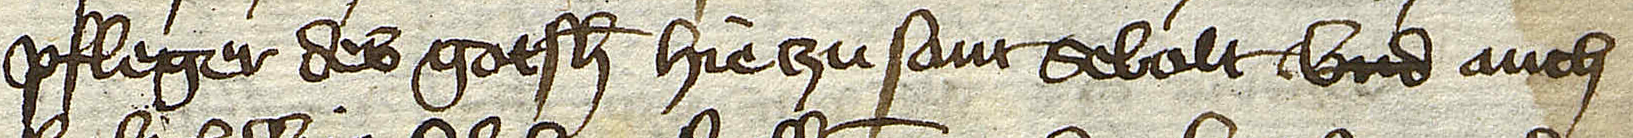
pfleger des gotſh* hie cʒu ſant Sebolt / vnd auch
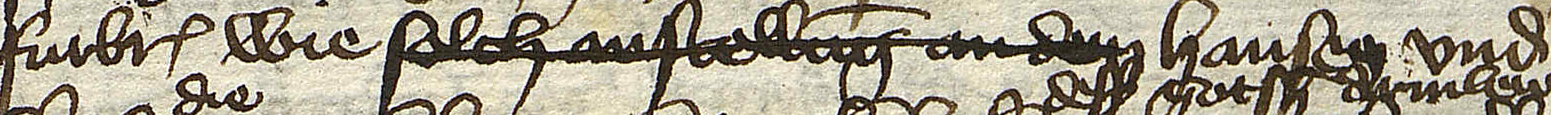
fürbr* wie ſolch auſtellu*g an dem hanſen vnd
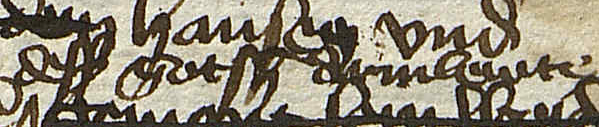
deſſ* gotſh* Armlewte
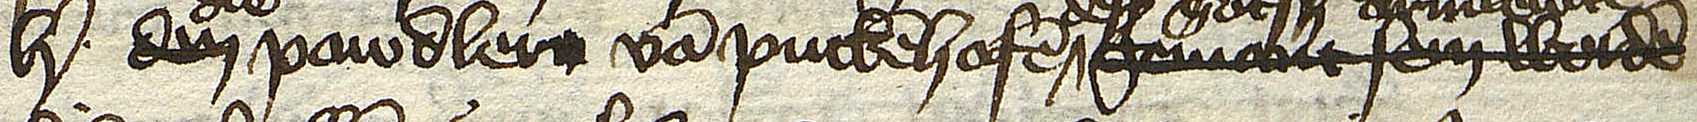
h* . den pawdlern vo* pucke*hofe* gemant ſein worde*
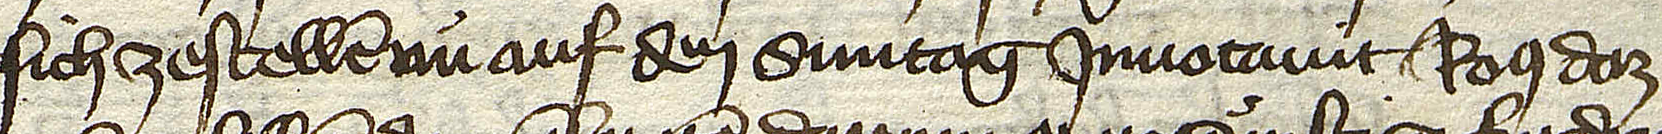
ſich cʒeſtelle* nü auf den Suntag Inuocauit / Ro* daʒ
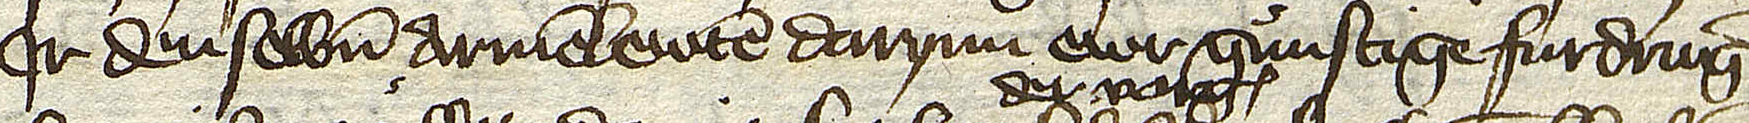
Ir denſelb*n Arme*lewte* darynn ewr günſtige furdrug*
